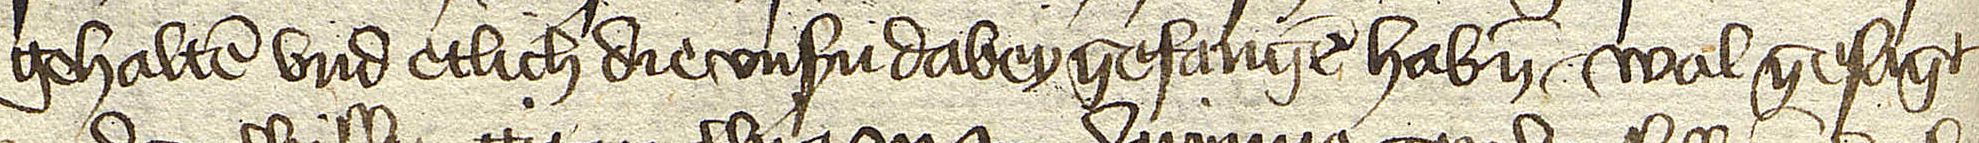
gehalte* vnd etlich die vnſ*n dabey gefange* habn* / wol geſagt
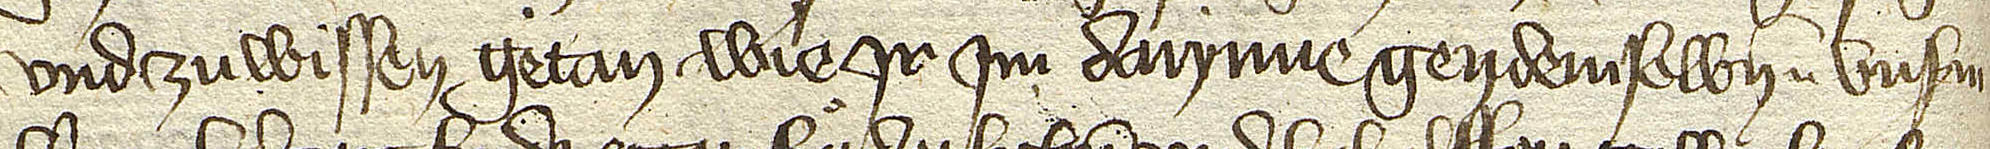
vnd cʒu wiſſen getan / wie Ir Im darynne gen demſelbn* ~ vnſ*m
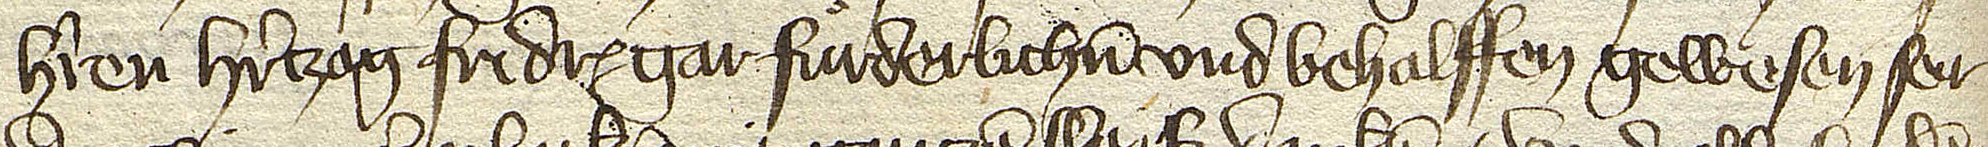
h*ren hr*cʒog fridr* gar fürderlichn* vnd beholffen geweſen ſeit
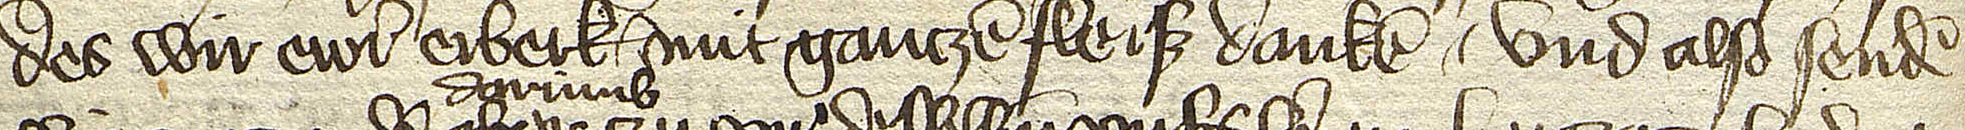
des wir ewr* erberk* mit gancʒe* fleiſʒ danke* / vnd alſo ſend*
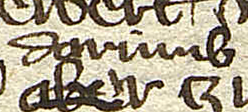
darümb
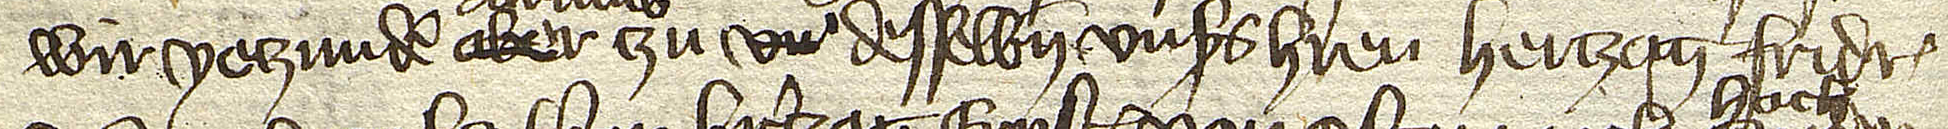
wir yecʒund* aber cʒu vn deſſelbn* vnſ*s h*ren hercʒog fridr*
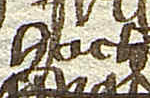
hoch*
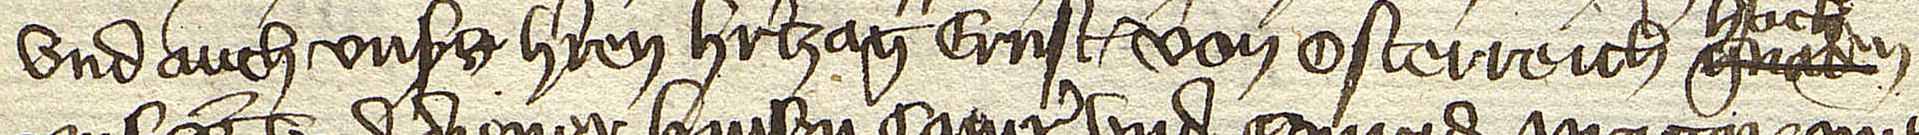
vnd auch vnſ*s h*ren hr*cʒog Ernſt* von Oſterreich gnaden
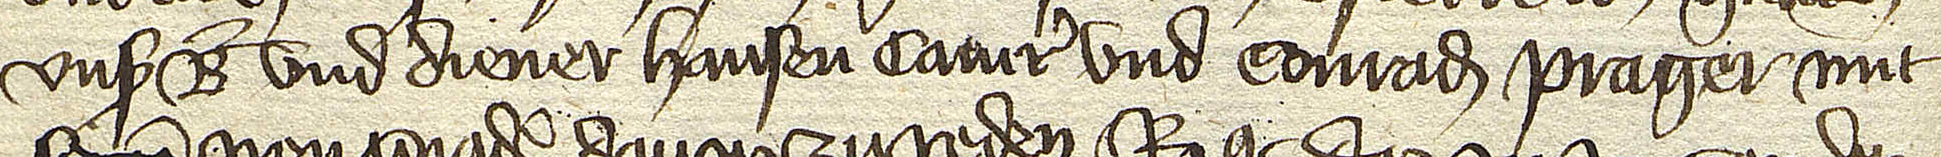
vnſ* B* vnd diener hanſen Camr* vnd Conrad Prager mit
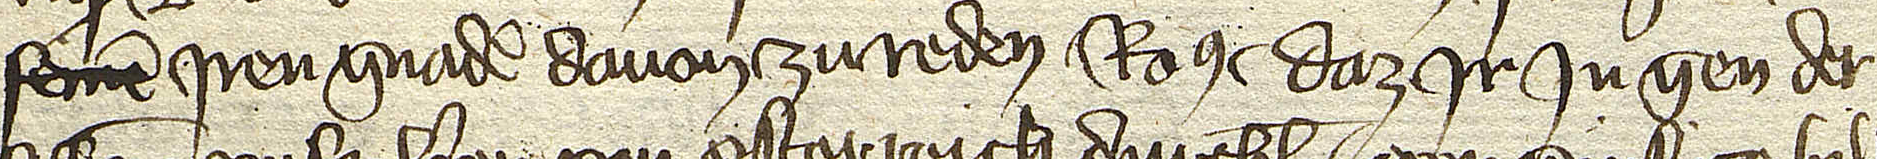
ſeine* Iren gnad* dauon cʒureden / Ro* / daʒ Ir In gen der
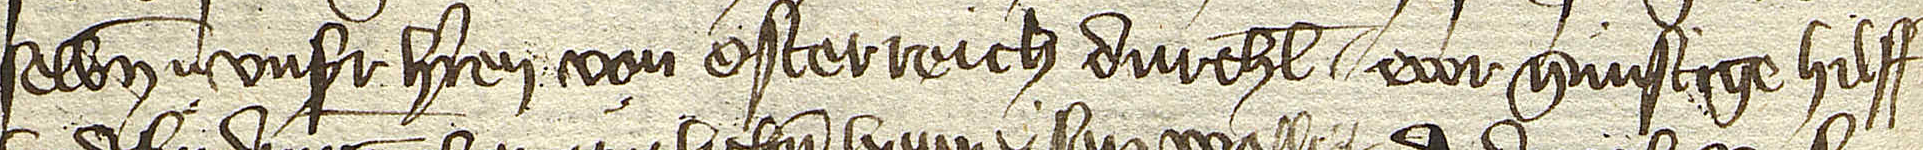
ſelbn* ~ vnſ*r h*ren von Oſterreich durchl* / ewr günſtige hilff
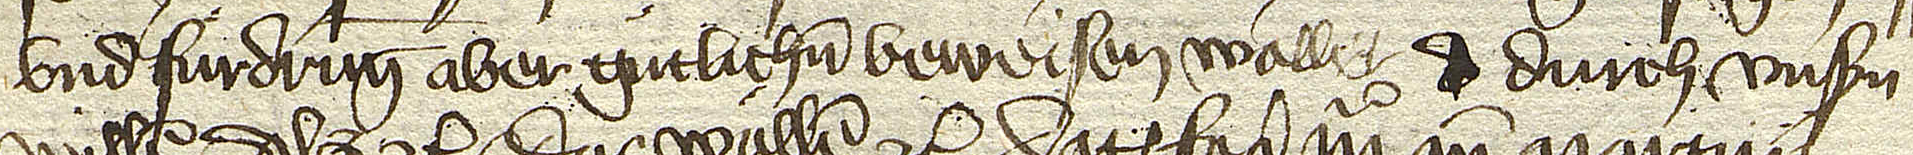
vnd fürdrug aber gütlichn* beweiſen wollet d durch vnſ*n
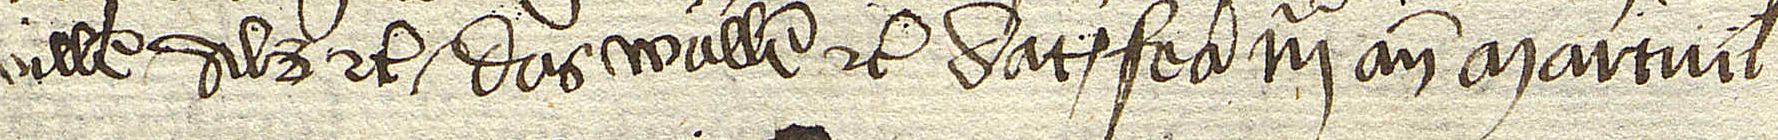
wille Als ec* / das wölle* ec* dat* fea* iii* an* Martini
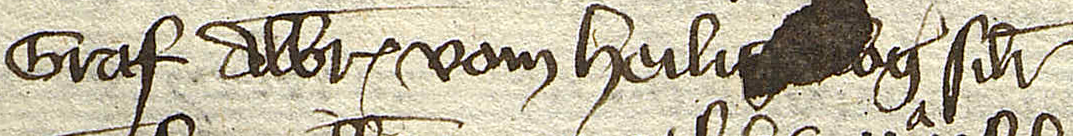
Graf Albr* vom heiligenbg* ſilr*
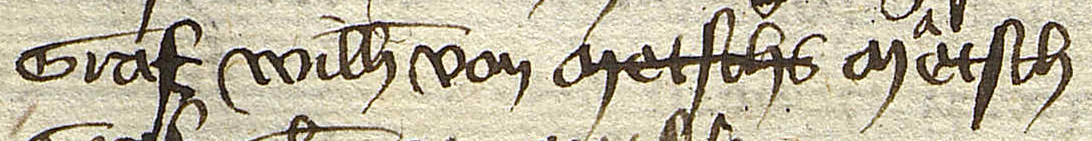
Graf wilh* von Metſchs Mëtſch
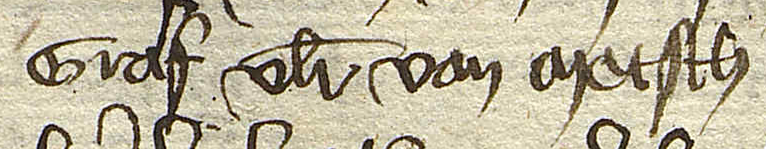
Graf vlr* von Metſch
